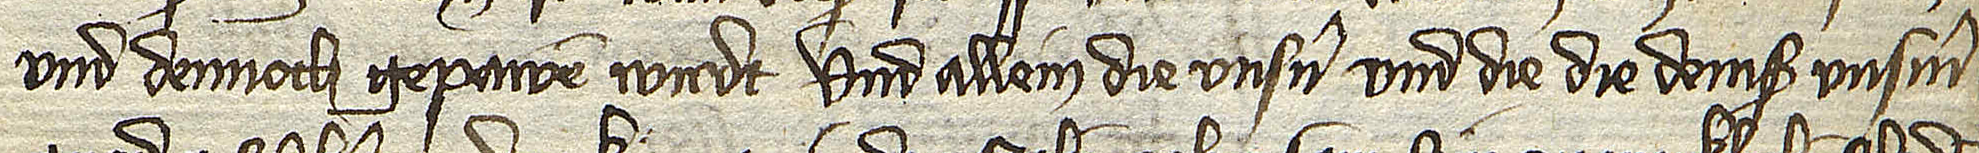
vnd dennoch gepawe* wirdt Vnd allein die vnſn* vnd die die demſ* vnſm*
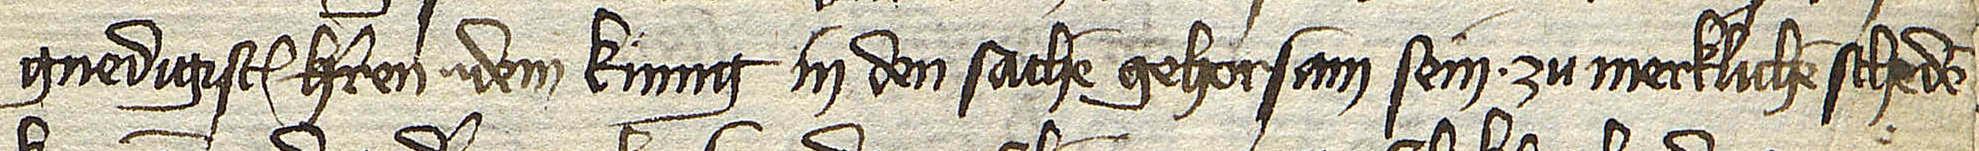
gnedigiſt* h*ren ~ dem künig in den ſache* gehorſam ſein . ʒu merkliche* ſchede*
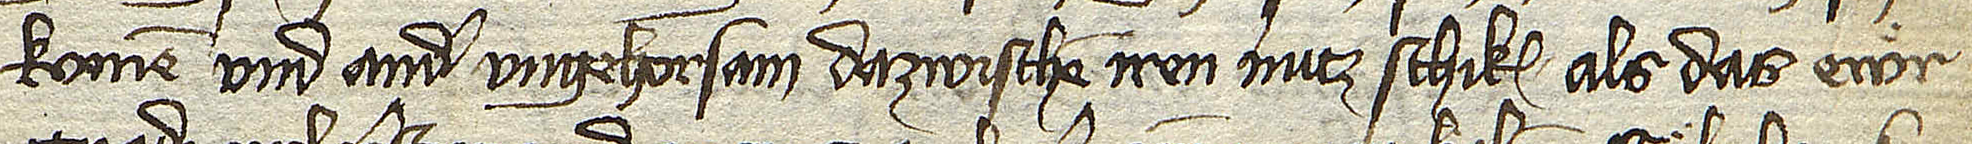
kome* vnd and* vngehorſam daʒwiſche* iren nucʒ ſchik* / als das eẅr
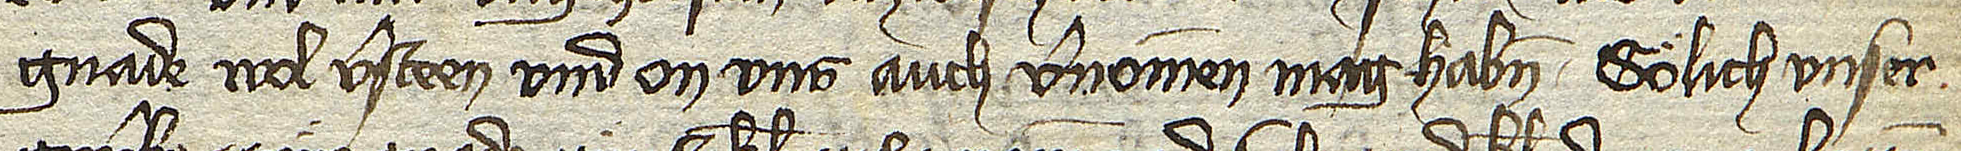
gnade wol v*ſteen vnd on vns auch v*nom*en mag habn* / Sölich vnſer
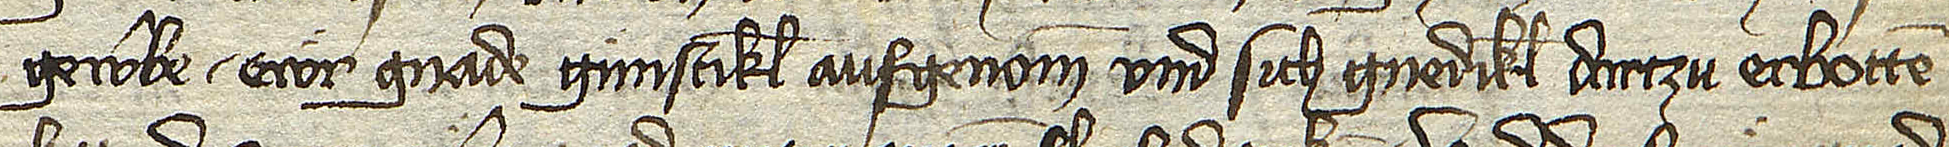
gew*be / eẅr gnade günſtikl* aufgenom* vnd ſich gnedikl* darcʒu erbotte*
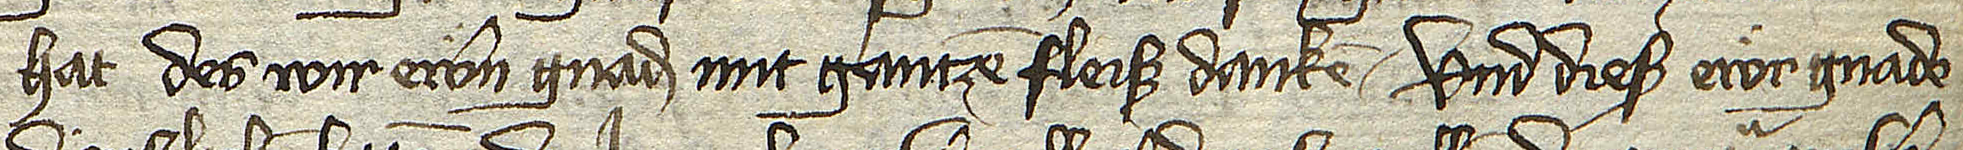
hat des wir eẅ*n gnad* mit gancʒe* fleiſʒ danke* / Vnd dieſ* eẅr gnade
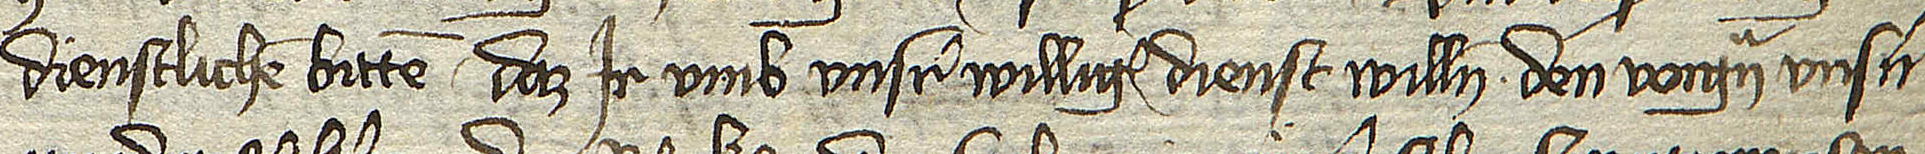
dienſtliche* bitte* / Daʒ Ir vmb vnſr* willig* dienſt willn* den vorgn* vnſn*
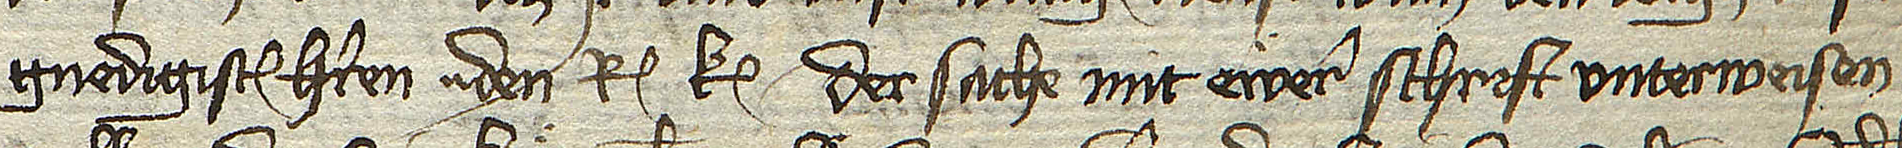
gnedigiſt* h*ren ~ den R* k* / Der ſache mit eẅer* ſchrift vnterweiſen
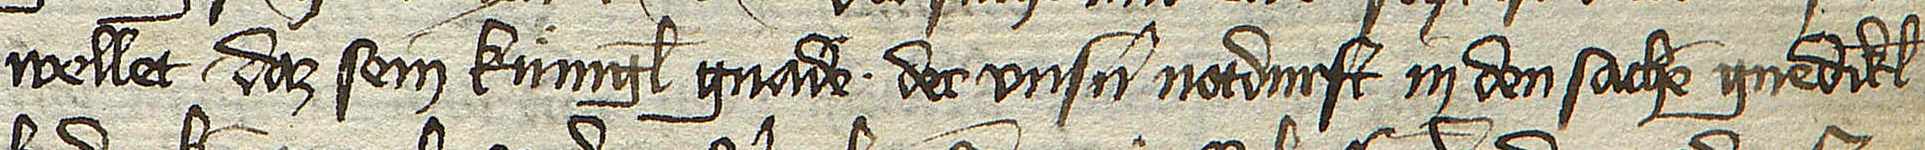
wellet / daʒ ſein künigl* gnade . der vnſn* notdurft in den ſache* gnedikl*
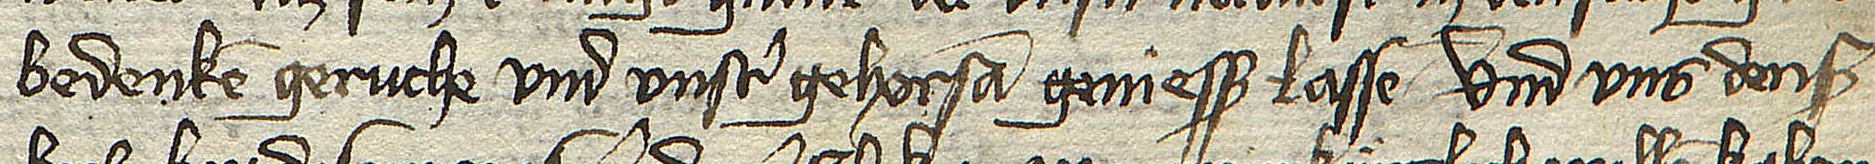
bedenke* geruche vnd vnſr* gehorſa* genieſſ* laſſe / Vnd vns denſ*
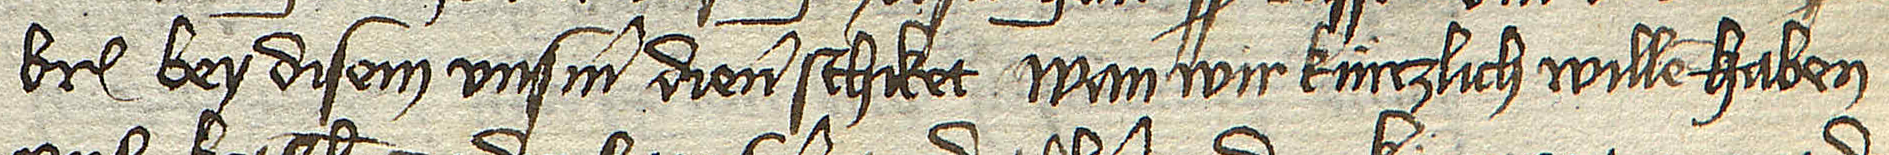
br* bey diſem vnſm* dien* ſchiket wan wir kürcʒlich wille* haben
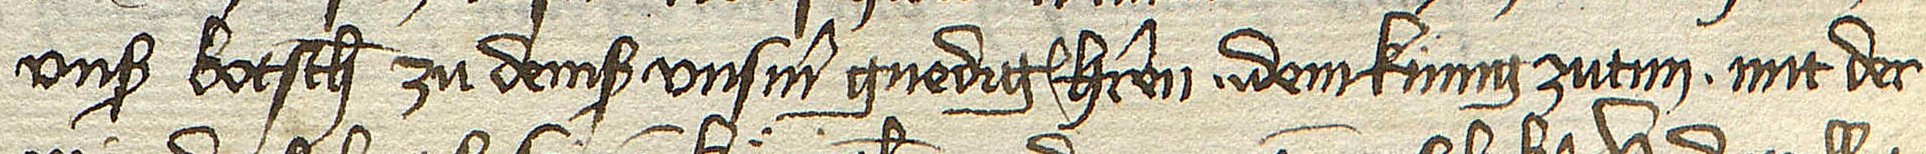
vnſ* botſch* ʒu demſ* vnſm* gnedig* h*ren ~ dem künig ʒutun . mit der
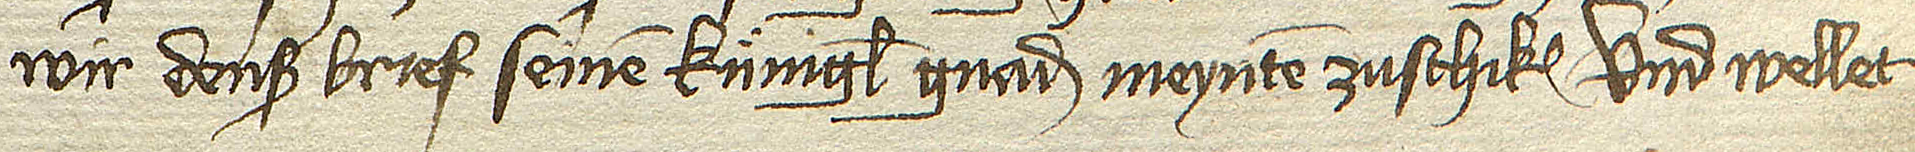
wir denſ* brief ſeine* künigl* gnad* meynte* ʒuſchik* / Vnd wellet
